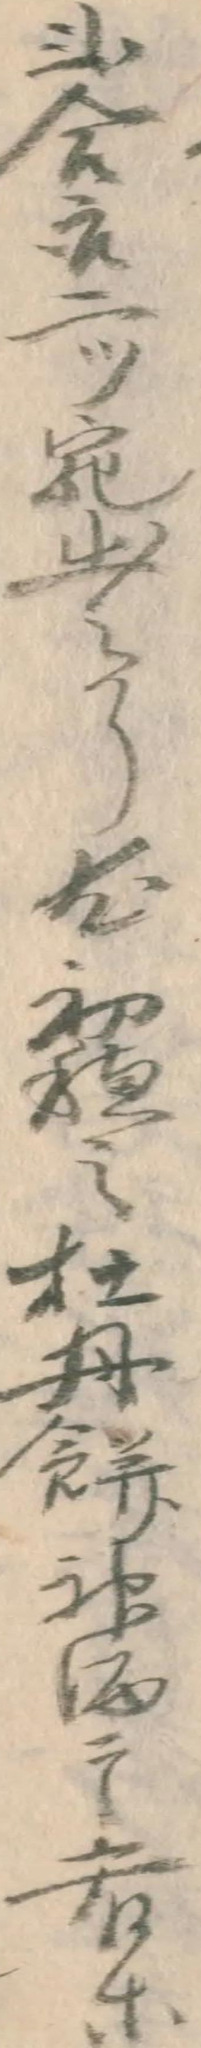弐合取二ツ宛出之了尤初穂之牡丹餅神酒干肴等
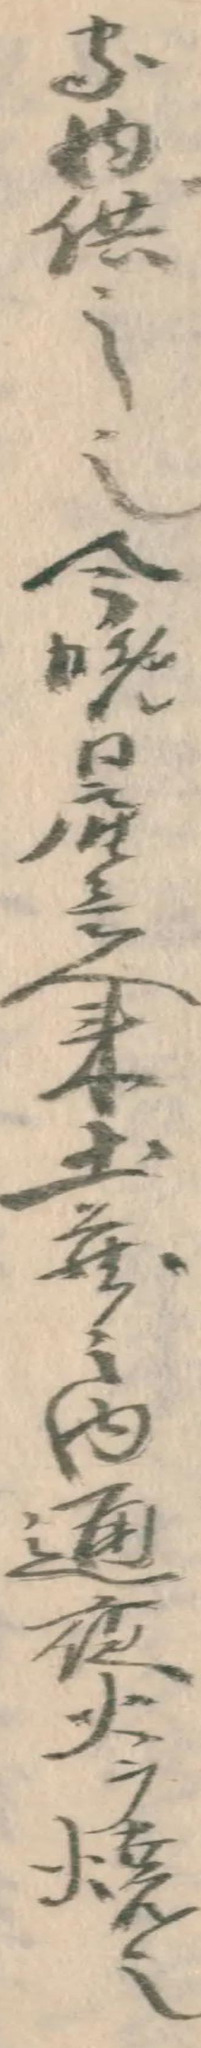家内供之也今晩日雇壱人来土蔵之内通夜火ヲ焼也
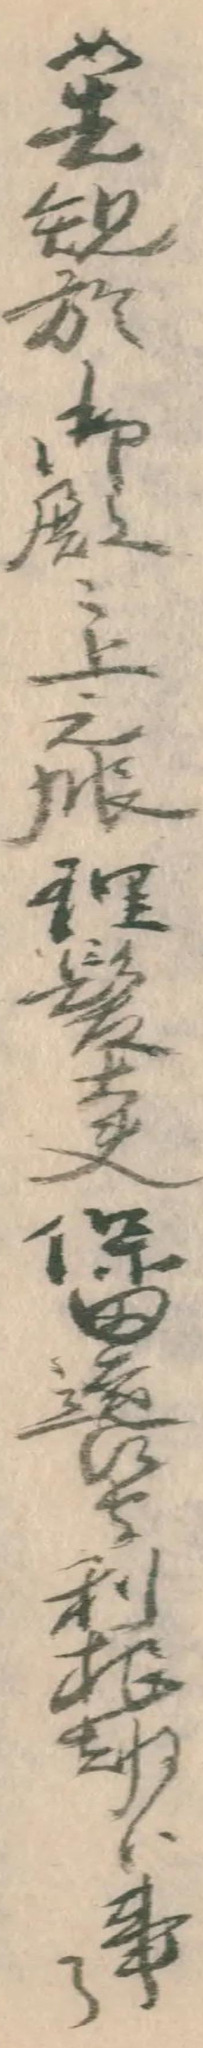如先規於御殿々上元服理髪大夫保田遠江守利根朝臣事了
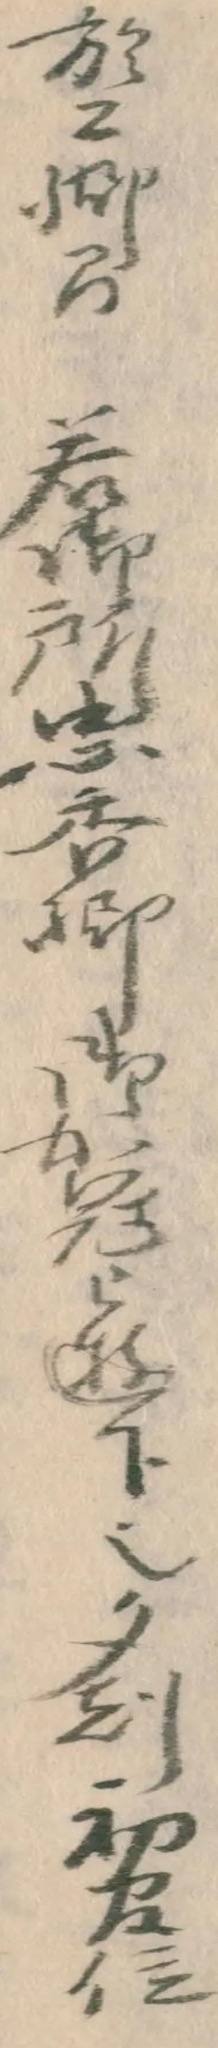於公卿局若御所忠香卿御加冠被遊下也夕刻初官位
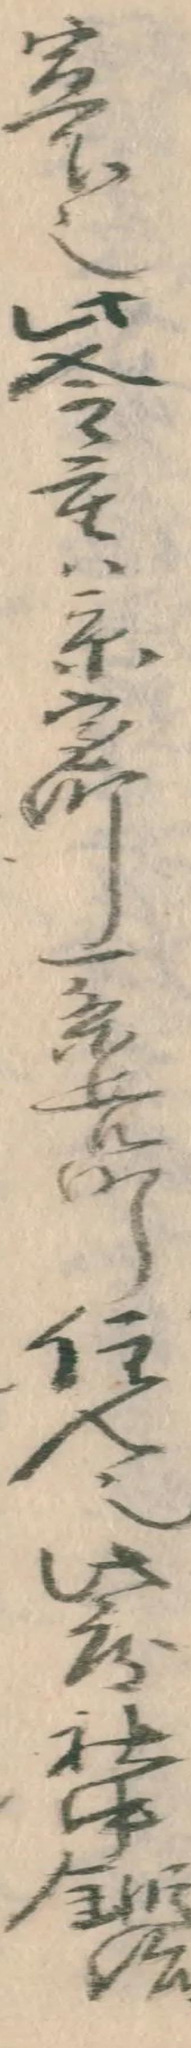宣下也此金重ハ京室町一条上ル町住人也此度社中鍛冶ニ
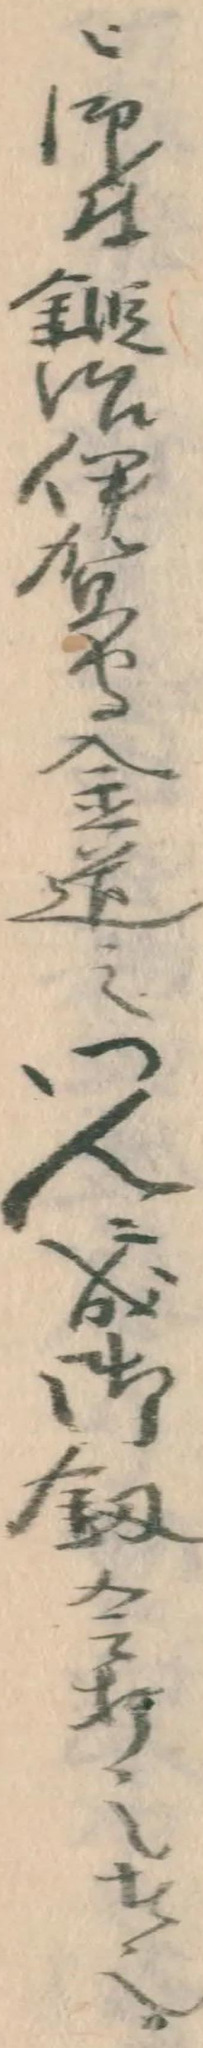被仰付鍛治伊賀守金道之同人ニ成御劔令打之者也
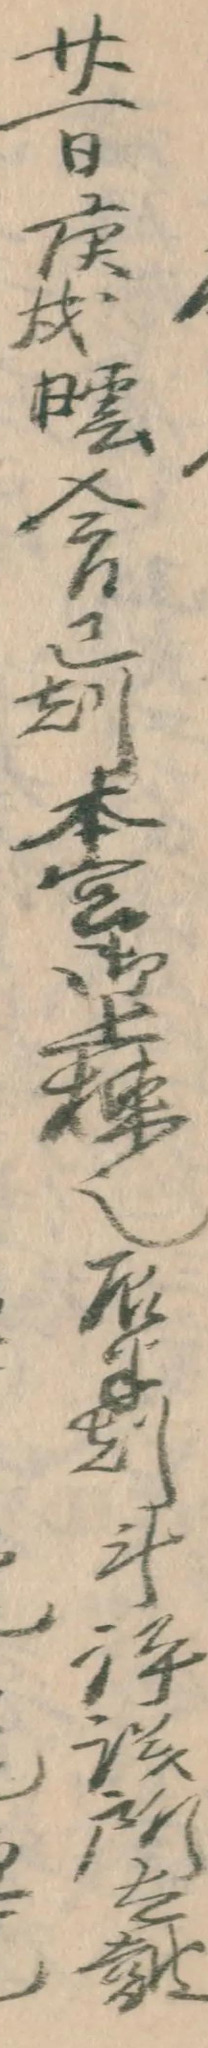廿一日庚戌晴今日巳刻本宮御上棟也辰半刻斗評議所太皷
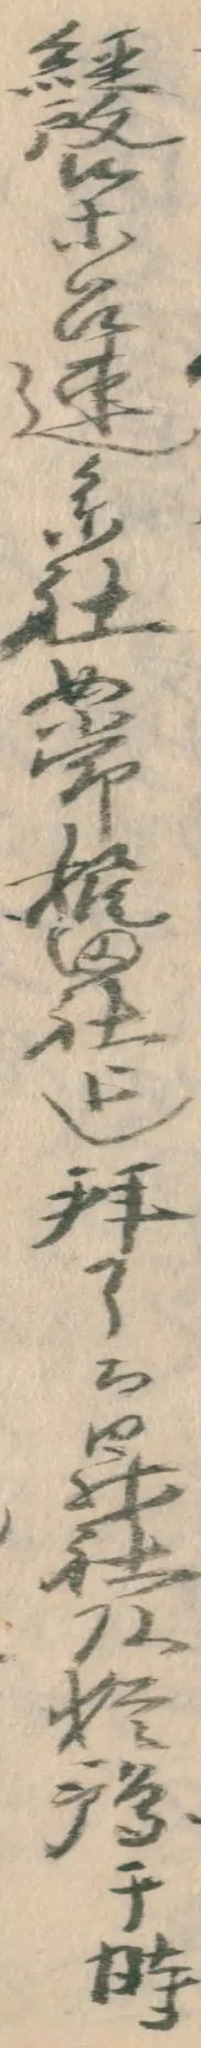経啓等召連参社如常梶田社迄拝了而昇社頭猶豫于時
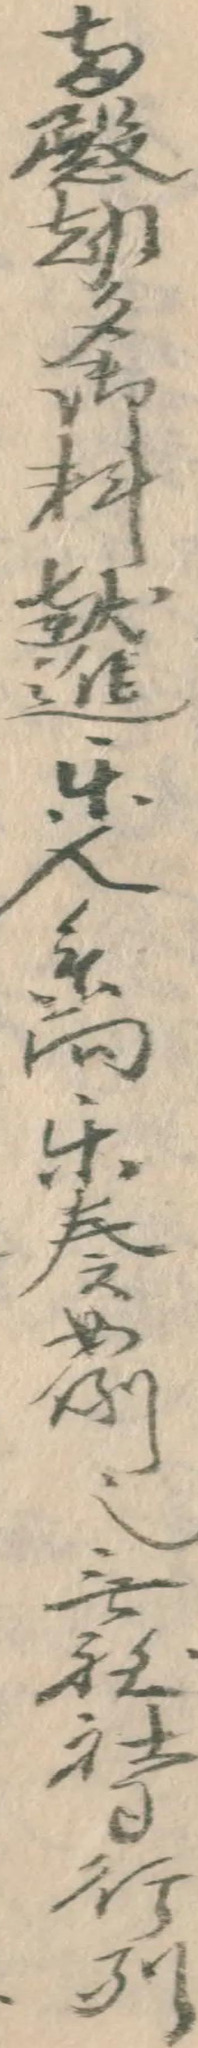両殿朝夕御料献進楽人参向楽奏如例也無程社司行列
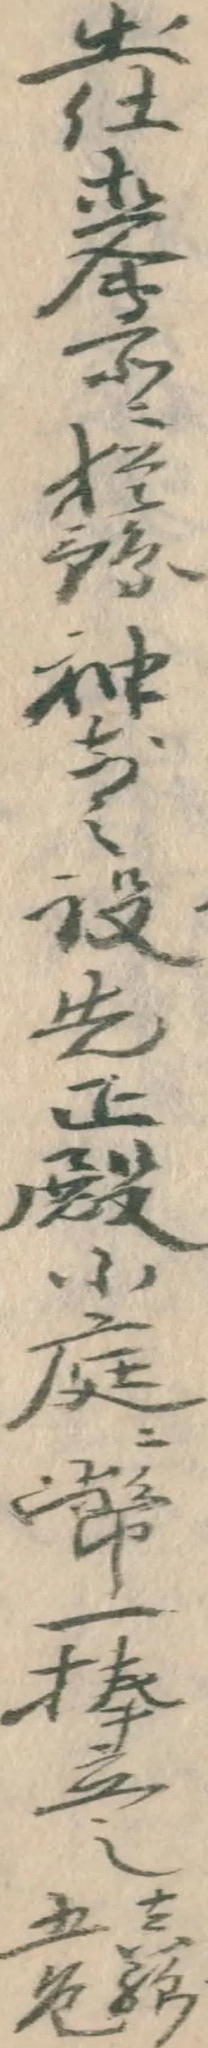出仕直會所ニ猶豫神前之役先正殿小庭ニ幣一捧立之真綿五色
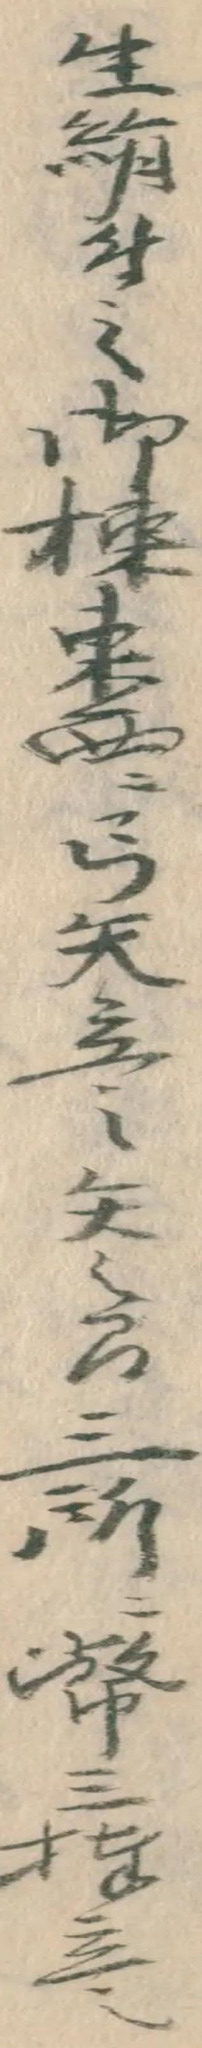生絹付之東西ニ弓矢立之矢之間三所に幣三捧立之
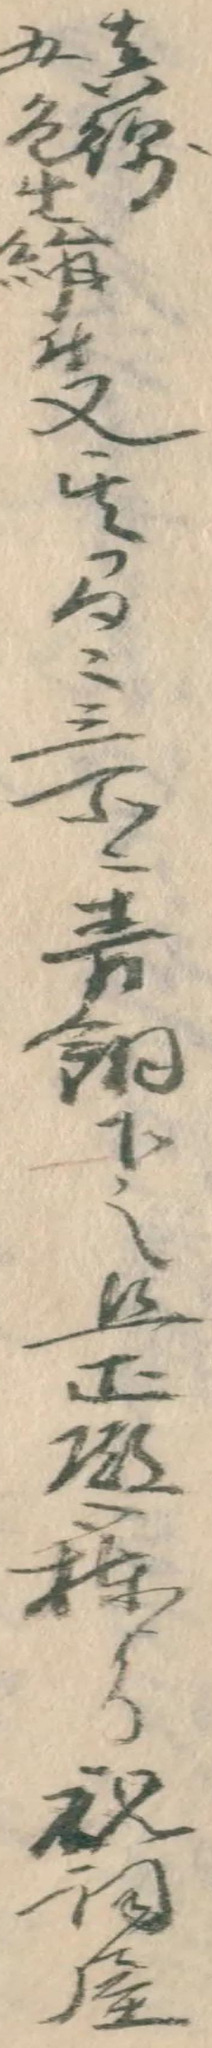真綿五色生絹付又其間二三所ニ青銅下也且正殿御棟より祝詞屋
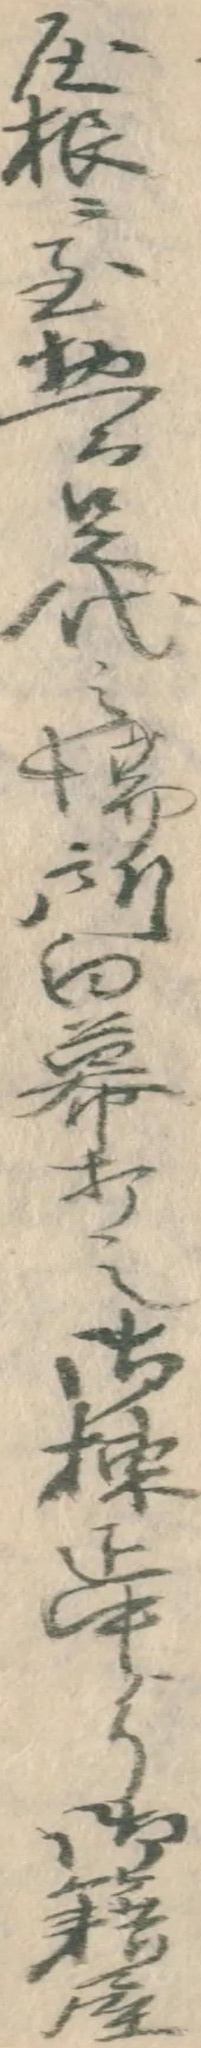屋根ニ至惣而足代之場所白幕打之御棟正中より御藉屋
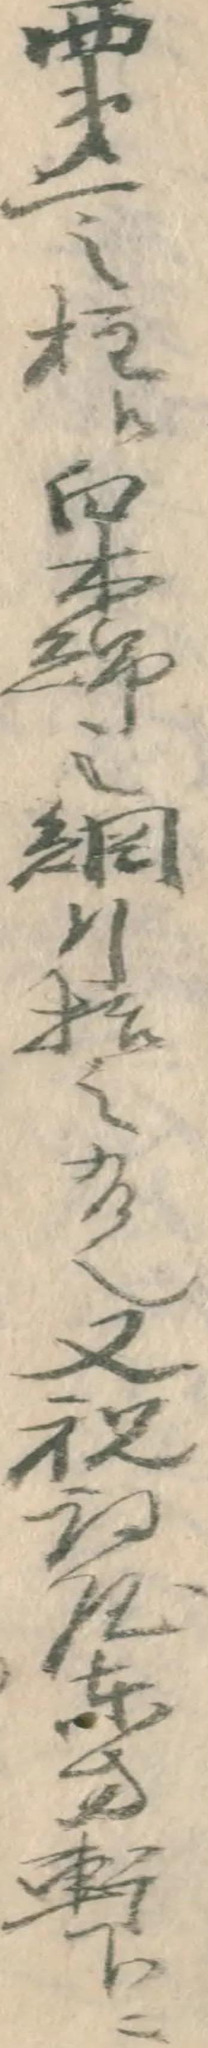西第一之柱え白木綿之網引様之有之又祝詞屋東方軒下ニ
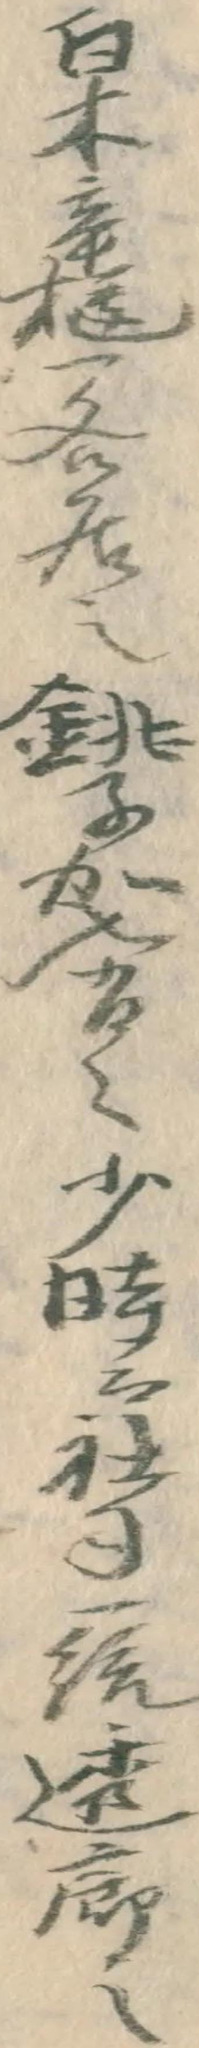白木辛櫃一各居之銚子加入有之少時而社司一統透廊之
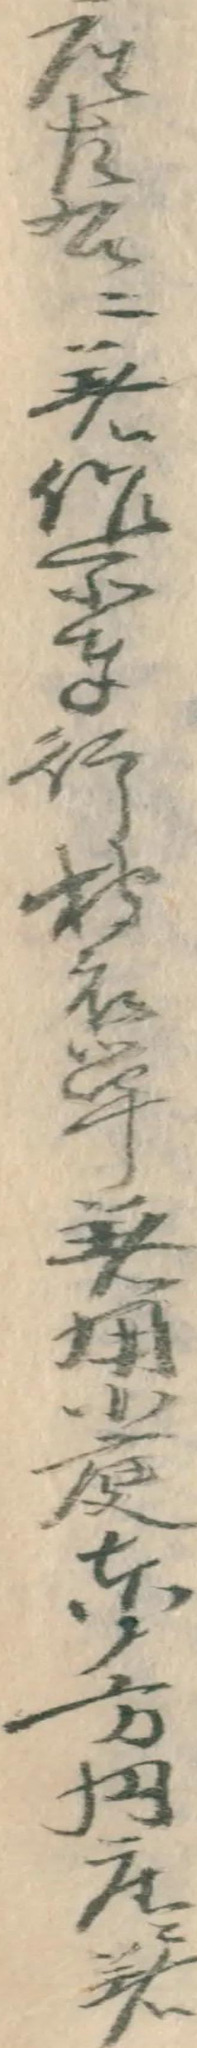座左右ニ着作所奉行披衣単着用小庭東ノ方円座ニ着
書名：賀茂社記録. 第67冊
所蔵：国立国会図書館 National Diet Library, JAPAN
